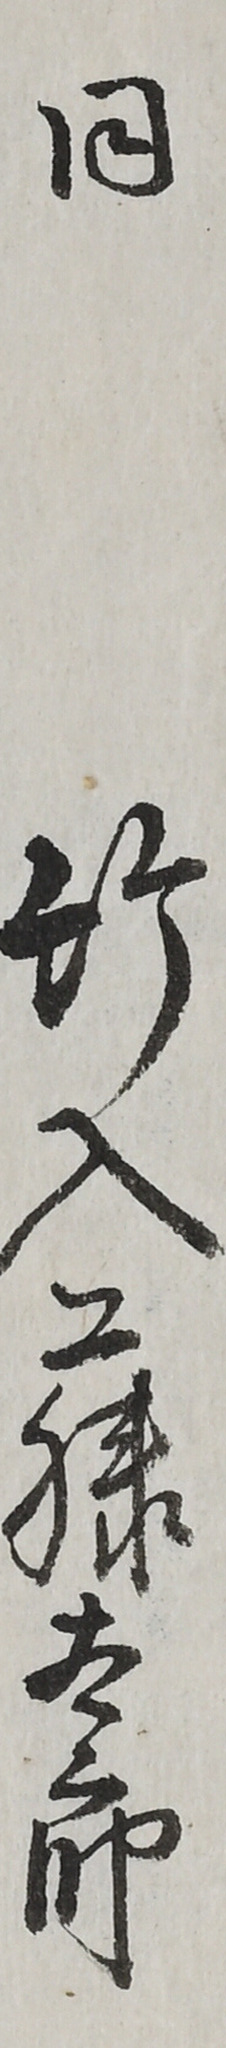同竹入藤太郎
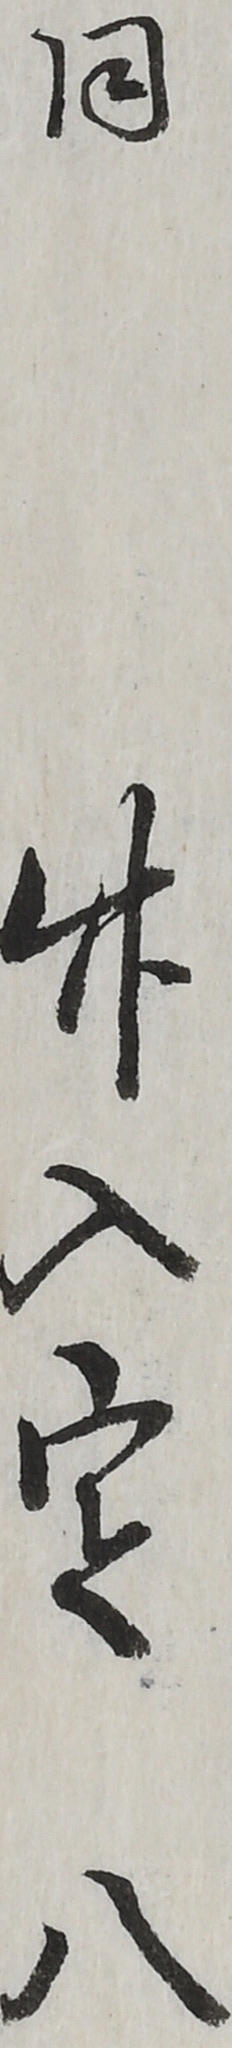同竹入定八
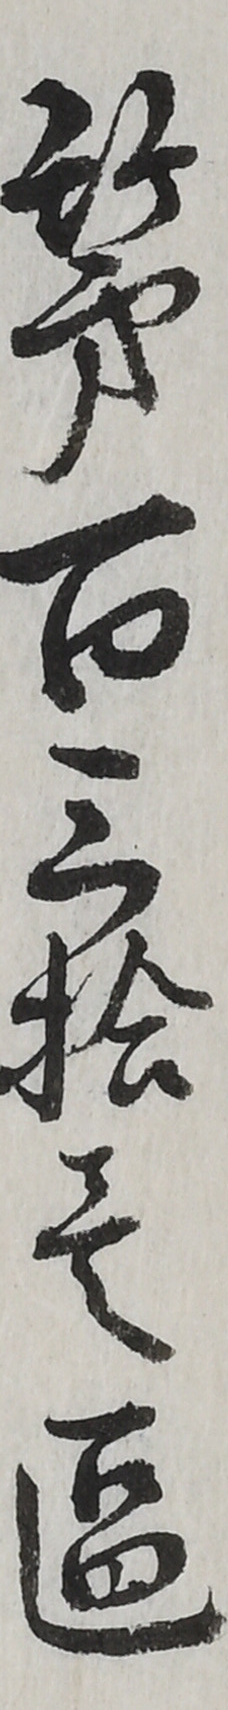第百三拾壱区
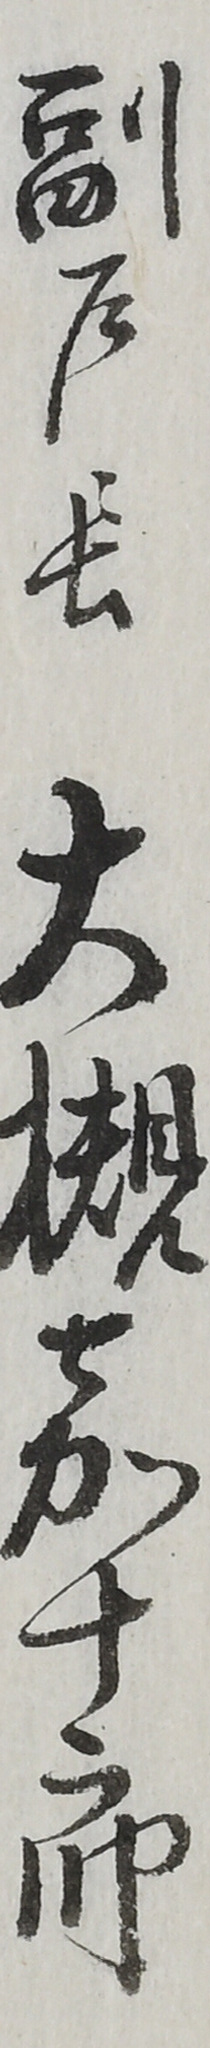副戸長大槻嘉十郎
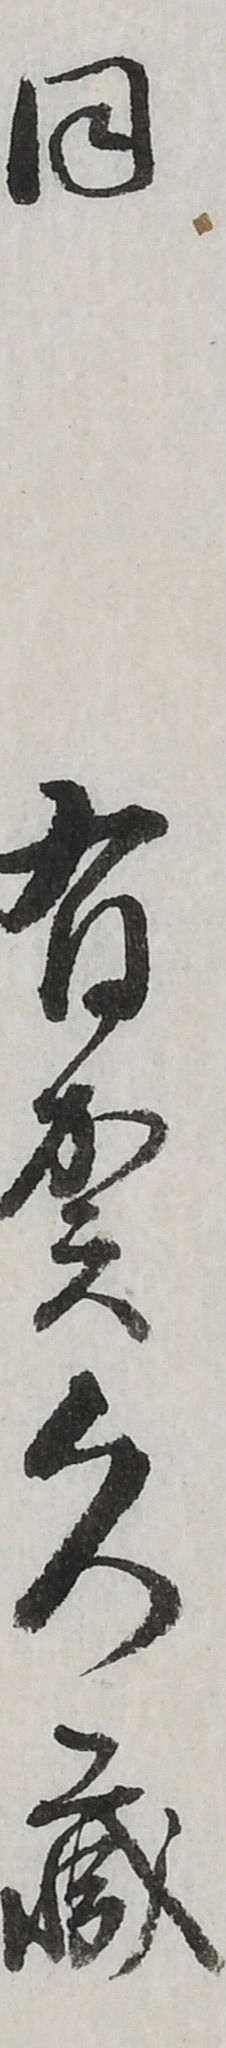同有賀久蔵
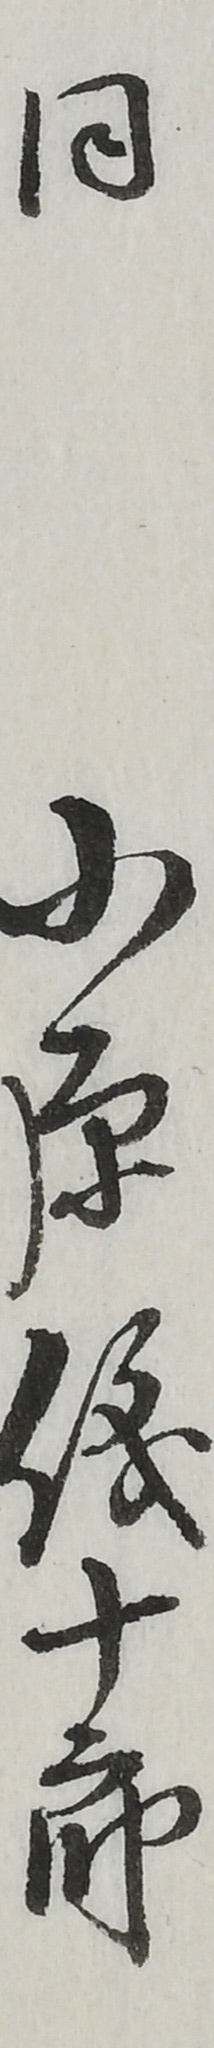同小原儀十郎
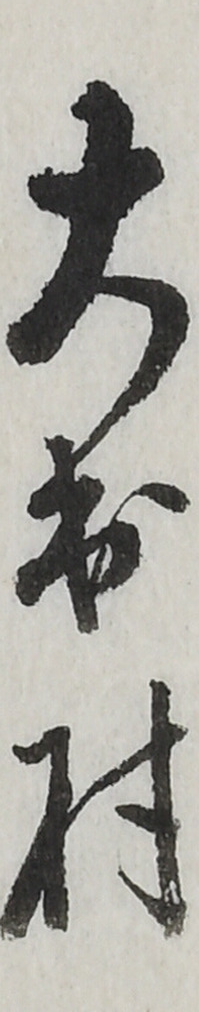大出村
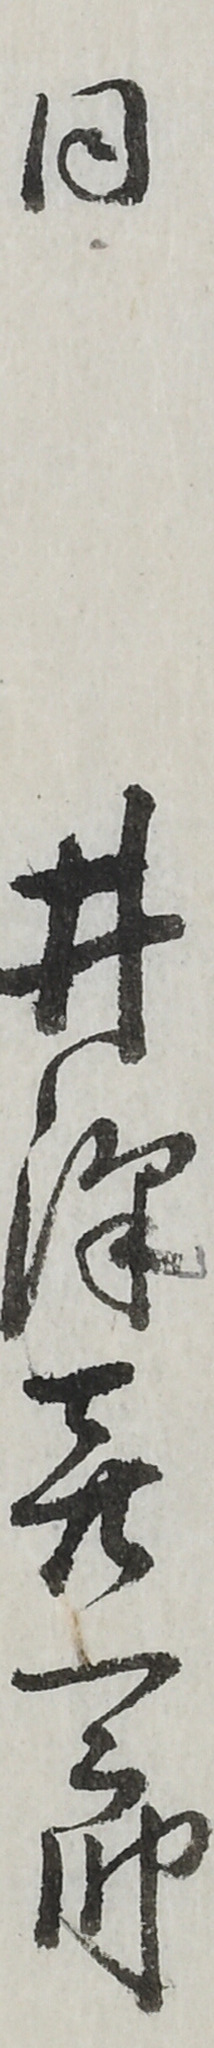同井澤喜一郎

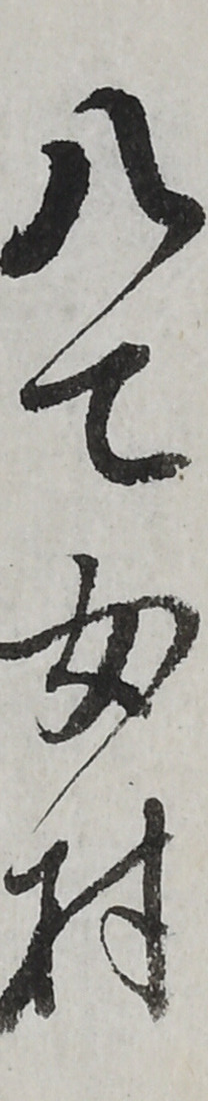八乙女村
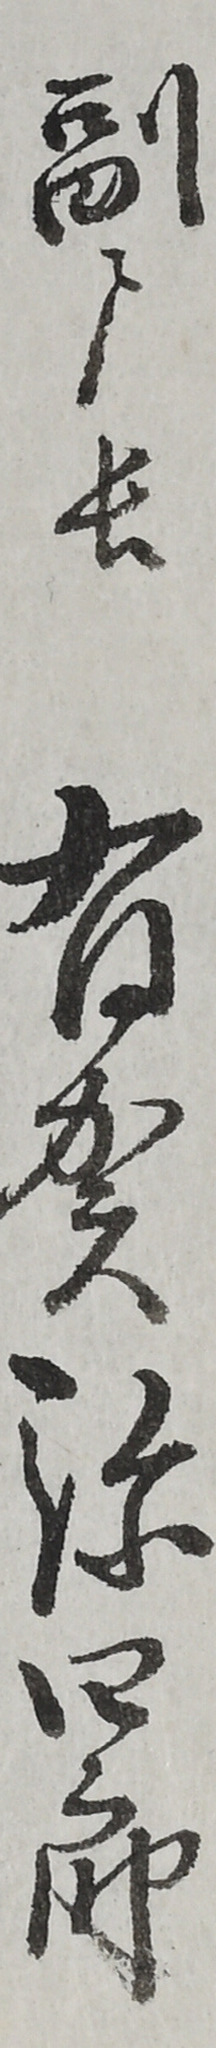副戸長有賀弥四郎
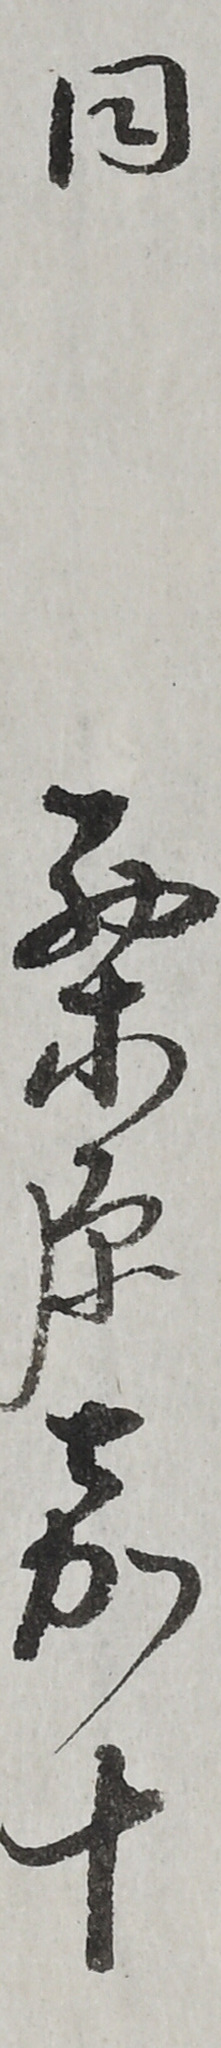同栗原嘉十
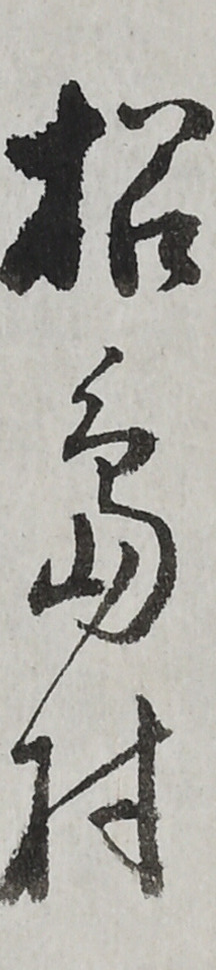松島村
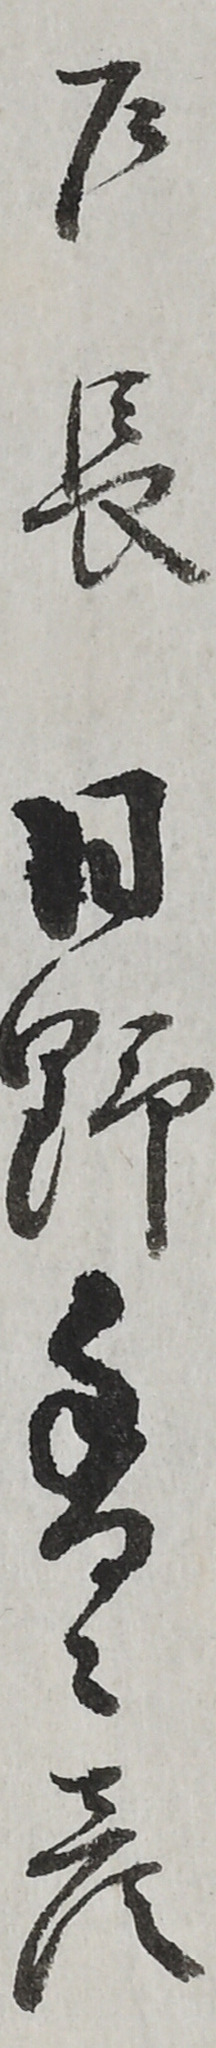戸長日野香々彦
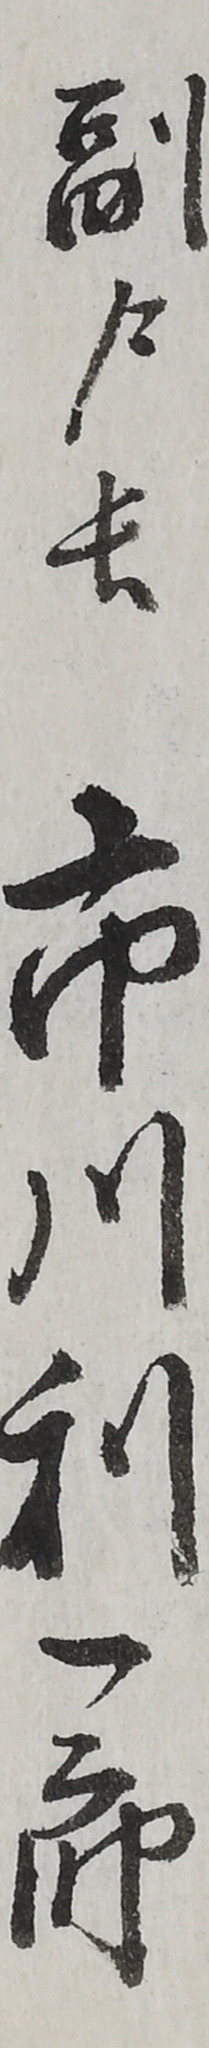副戸長市川利一郎
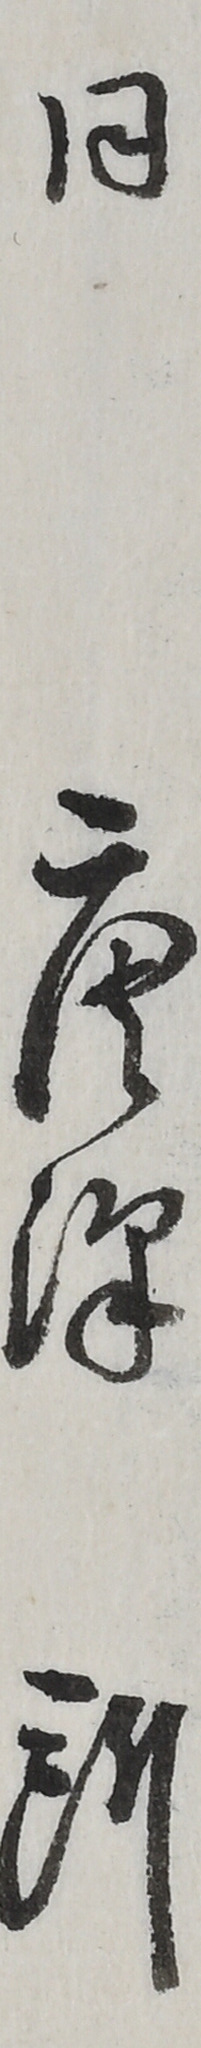同唐澤所
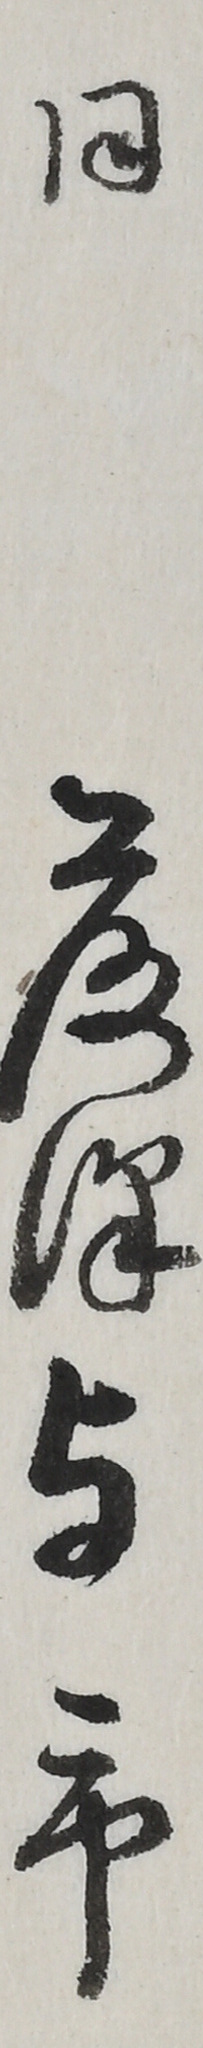同藤澤与市
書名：伊那郡毎村戸長副戸長名簿
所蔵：伊那市立高遠町図書館・合同会社AMANE
